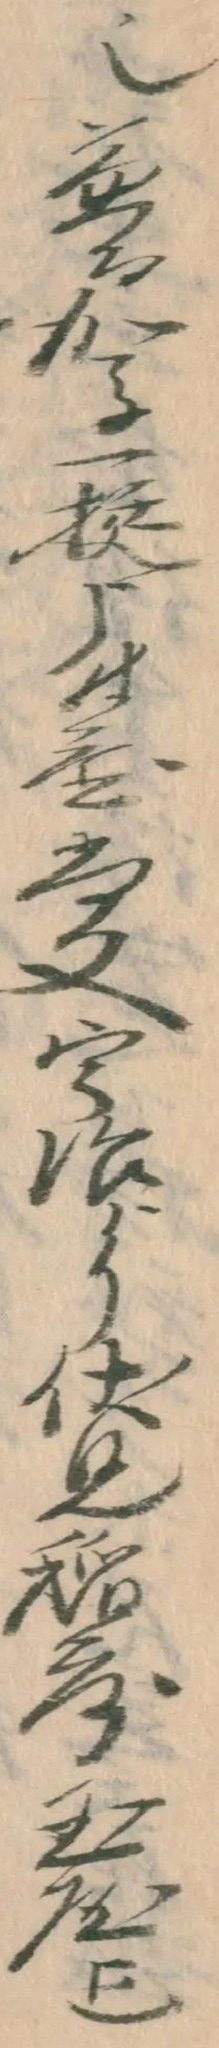之兼而駕一挺申付置尚又宇治より伏見稲荷玉屋迄
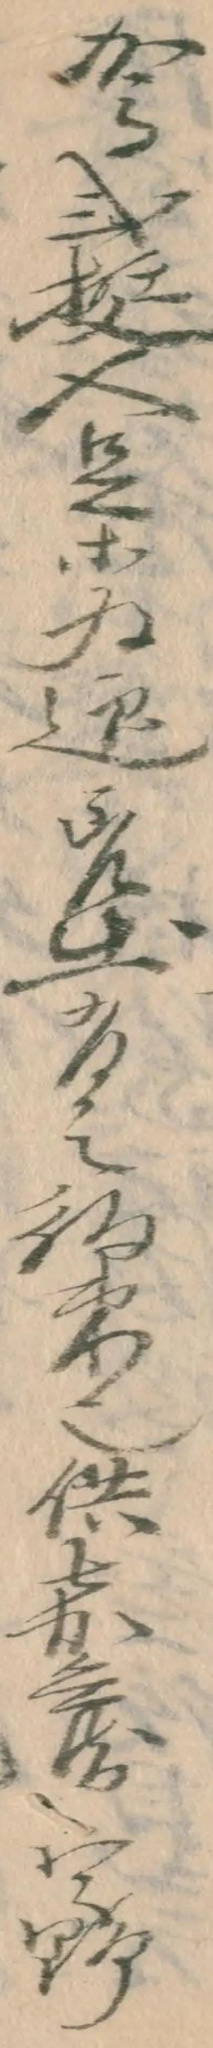駕弐挺人足等為迎差出有之約束也供嘉兵衛うの
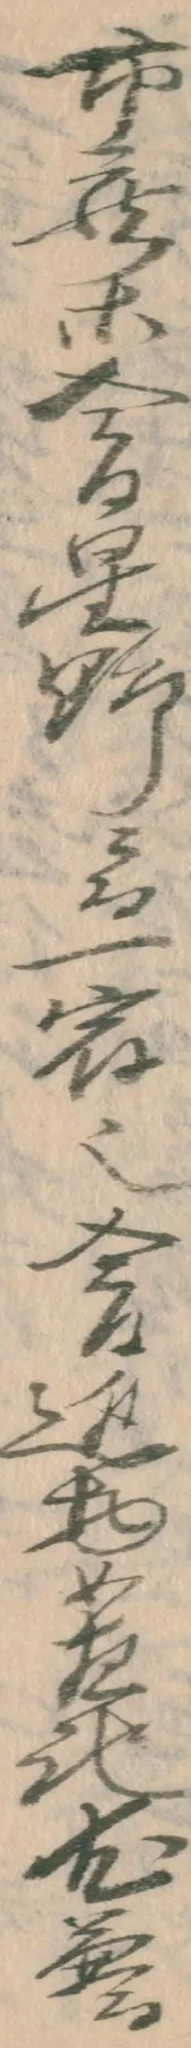市蔵等今日星野ニ而一宿也今日進物如左記尤兼而
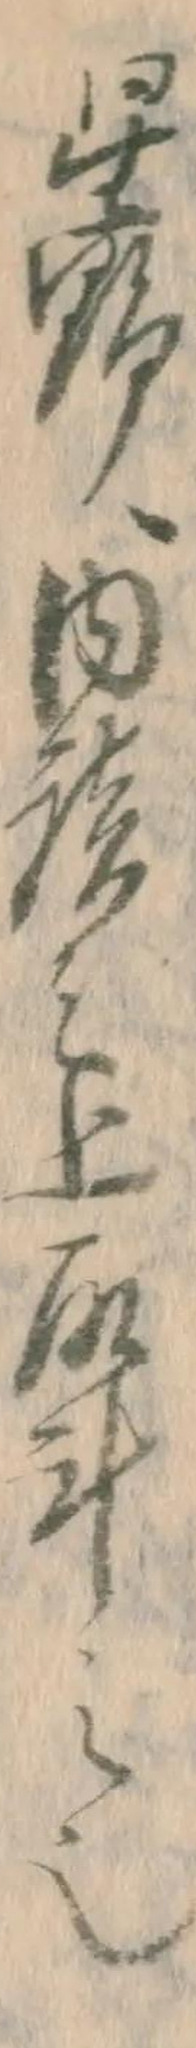星野へ内談之上取斗之也
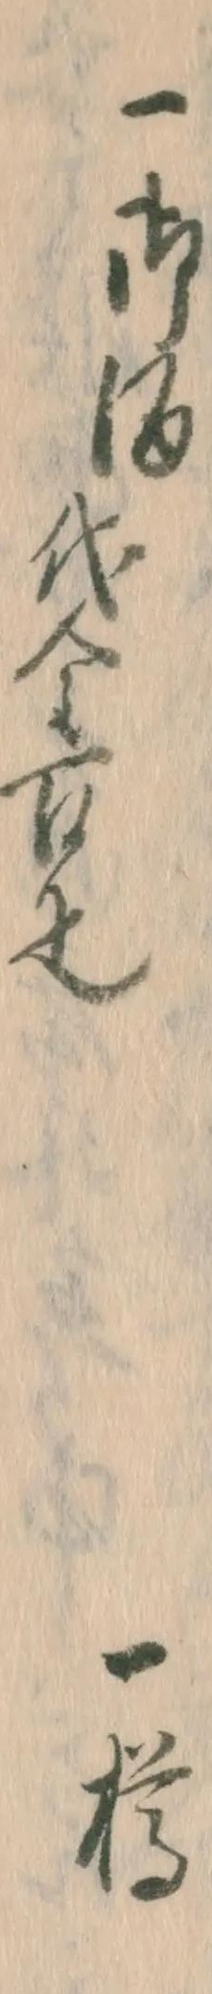一御酒代金百疋一樽
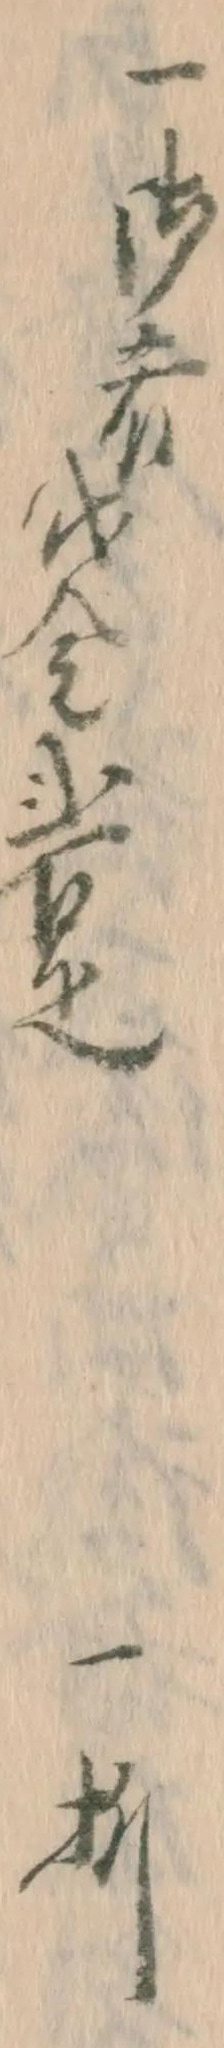一御肴代金弐百疋一折
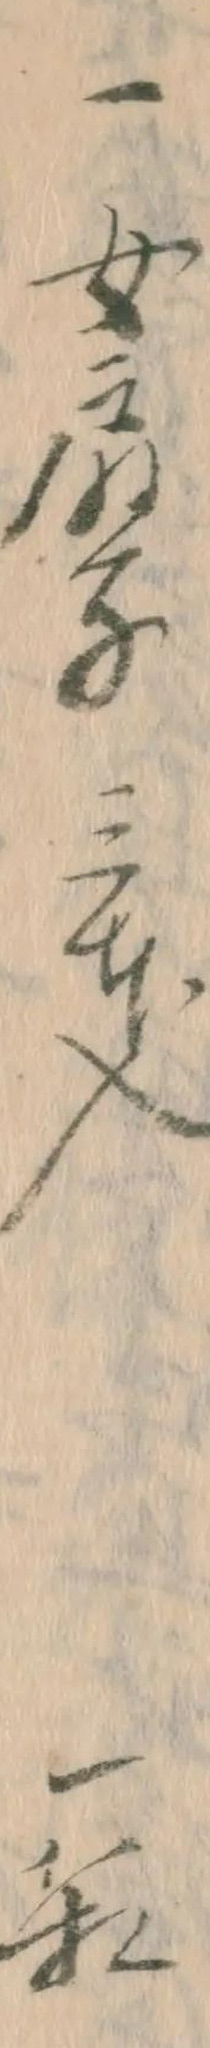一女扇子三本入一箱
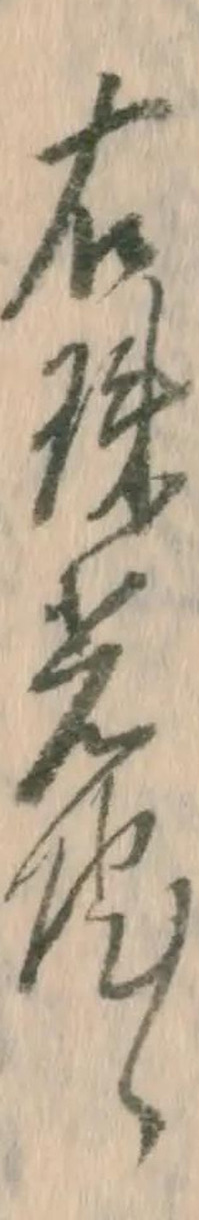右珠光院へ
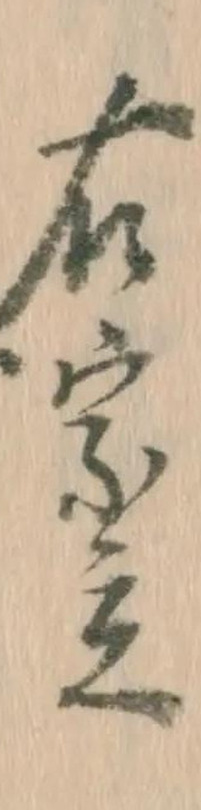右宗立
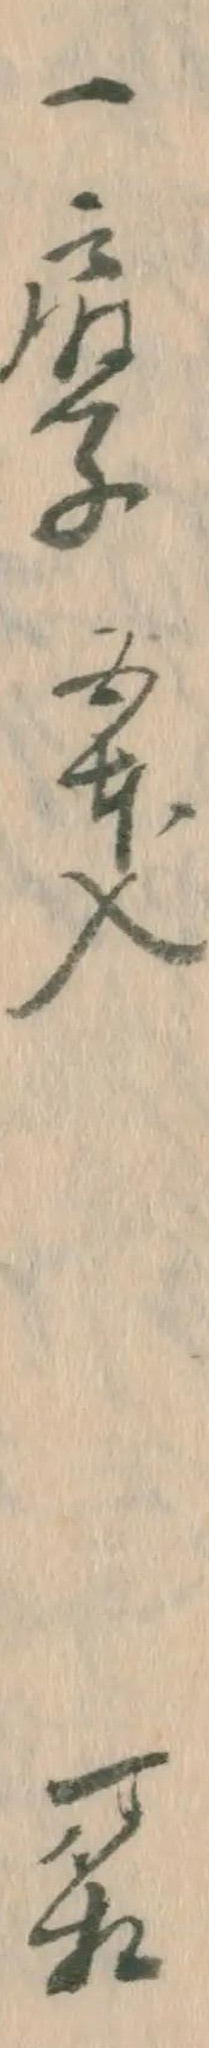一扇子五本入一箱
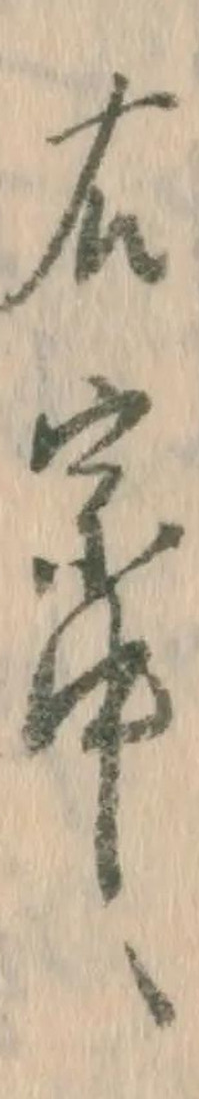右宗中へ
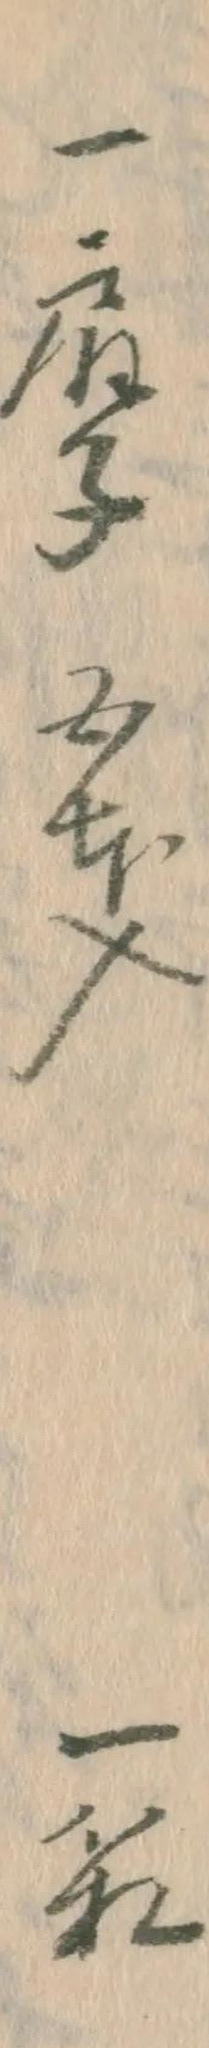一扇子五本入一箱
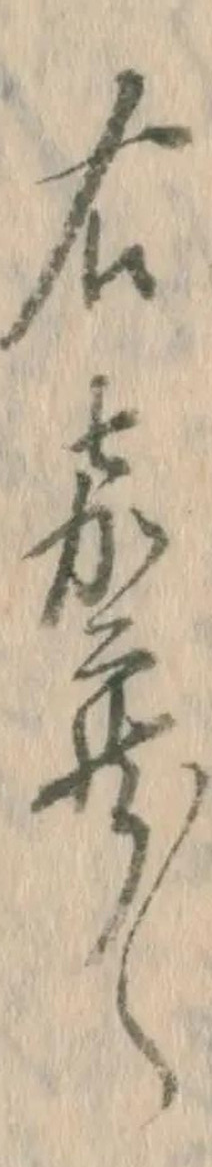右嘉蔵へ
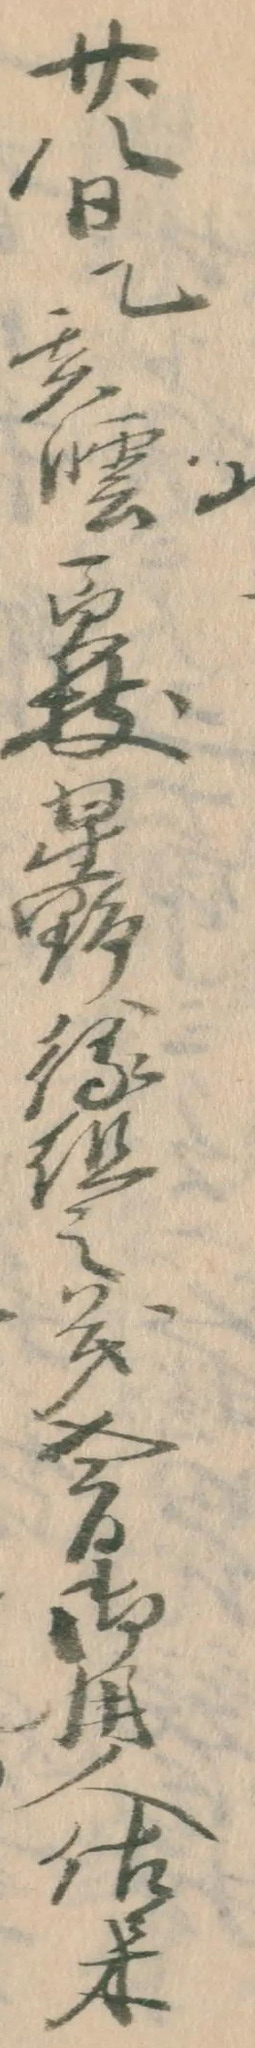廿八日乙亥曇美枝星野へ縁組之義今日御用人佐々木
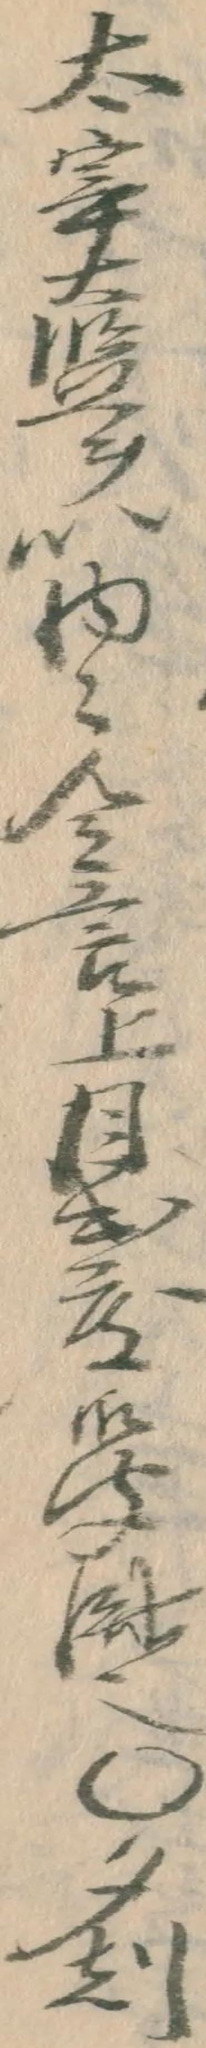太宰大監ヲ以内々令言上目出度御聞済也○夕刻
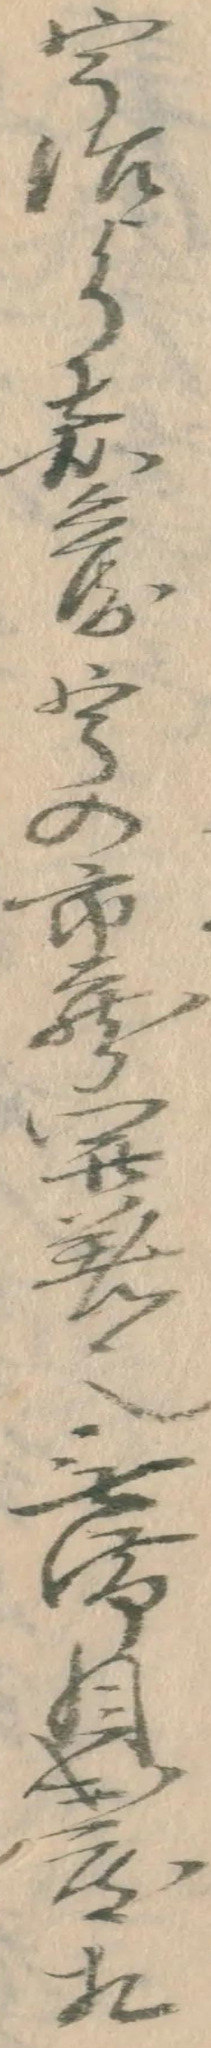宇治より嘉兵衛うの市蔵開着之無滞目出度相
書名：賀茂社記録. 第67冊
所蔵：国立国会図書館 National Diet Library, JAPAN
